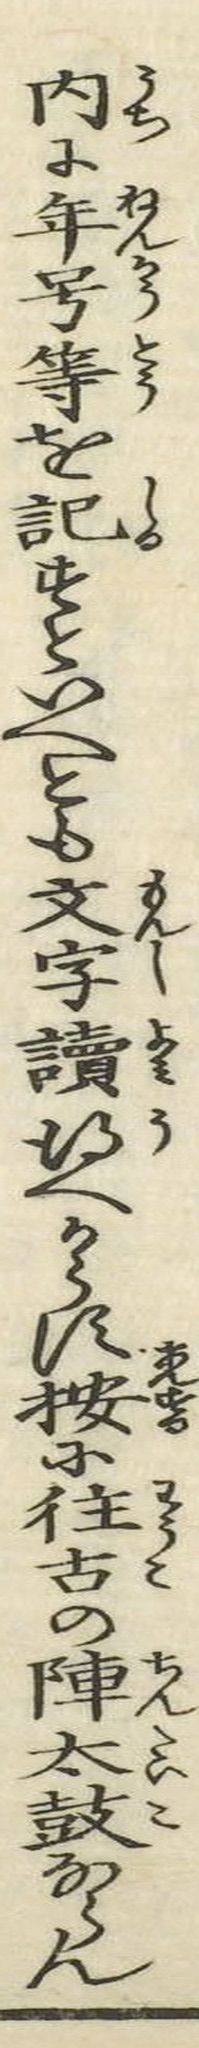内に年号等を記すといへとも文字読得へからす按に往古の陣太鼓ならん
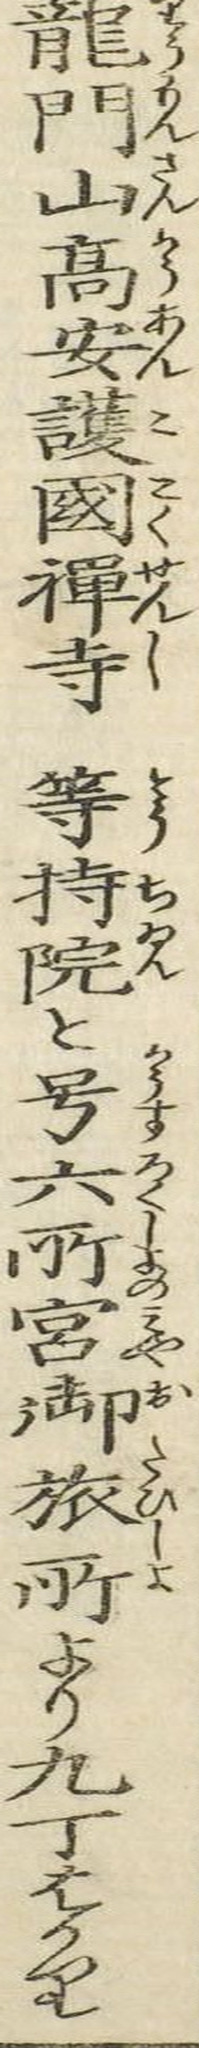龍門山高安護国禅寺等持院と号六所宮御旅所より九丁はかり
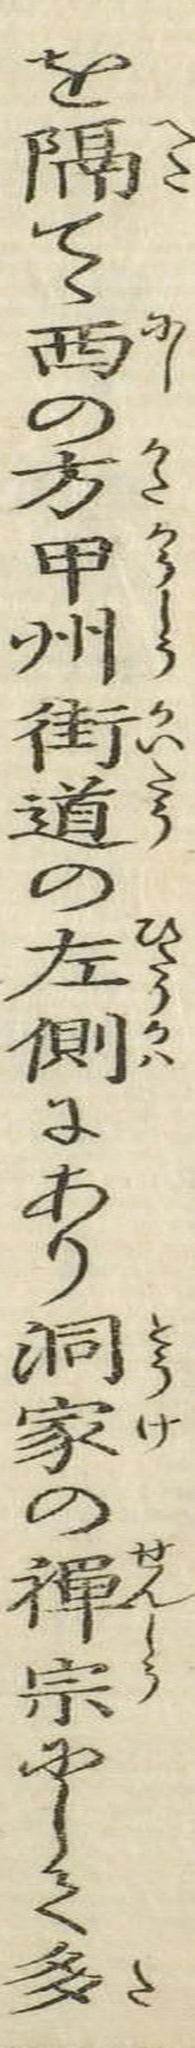を隔てゝ西の方甲州街道の左側にあり洞家の禅宗にして多
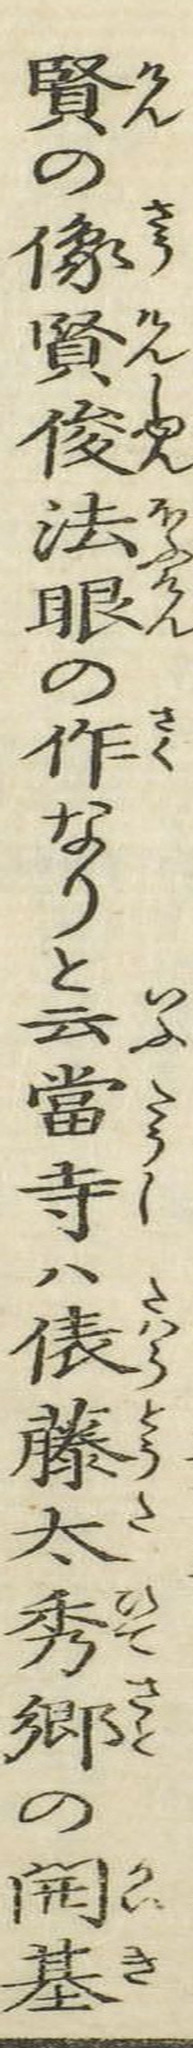賢の像賢俊法眼の作なりと云当寺は俵藤太秀郷の開基
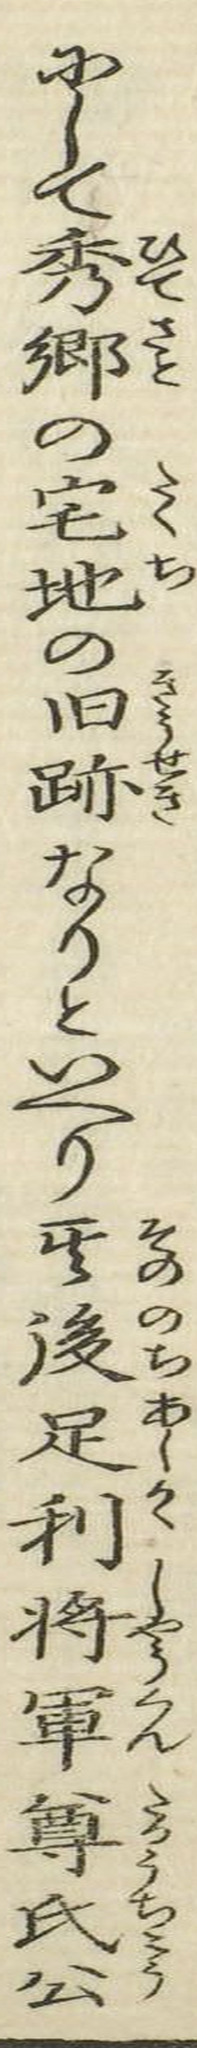にして秀郷の宅地の旧跡なりといへり其後足利将軍尊氏公
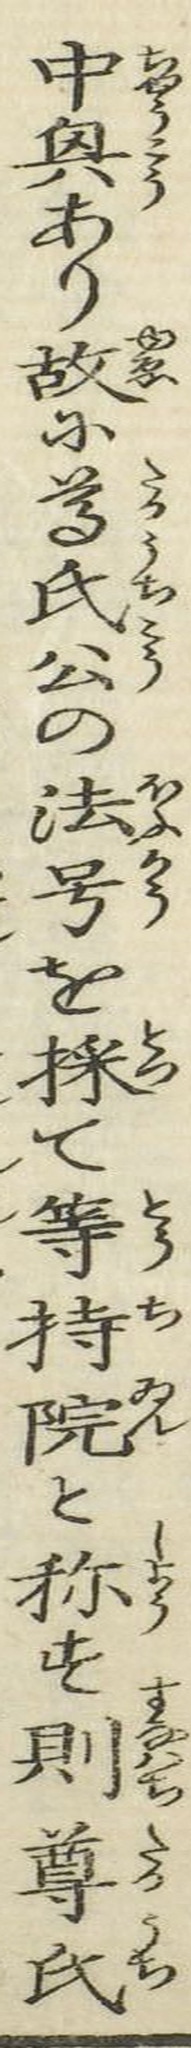中興あり故に尊氏公の法号を採て等持院と称す則尊氏
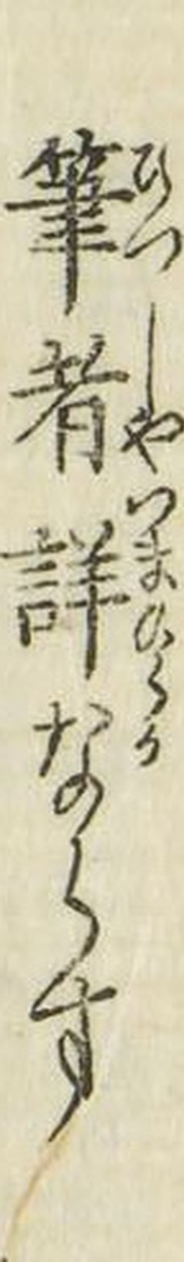筆者詳ならす

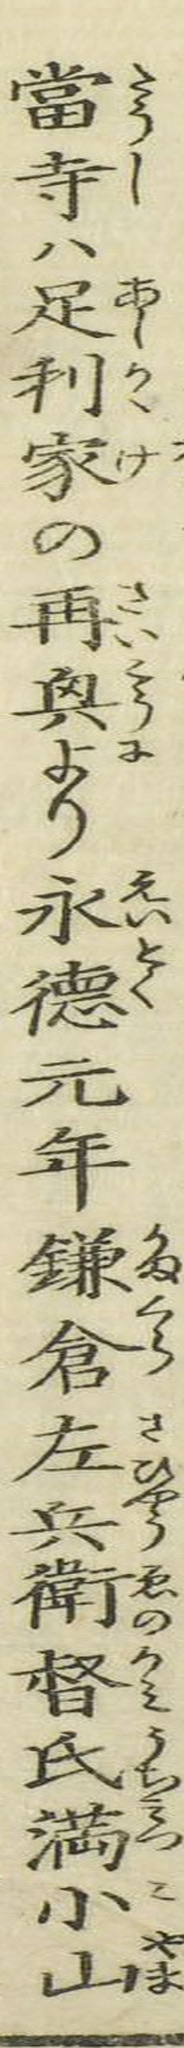当寺は足利家の再興より永徳元年鎌倉左兵衛督氏満小山
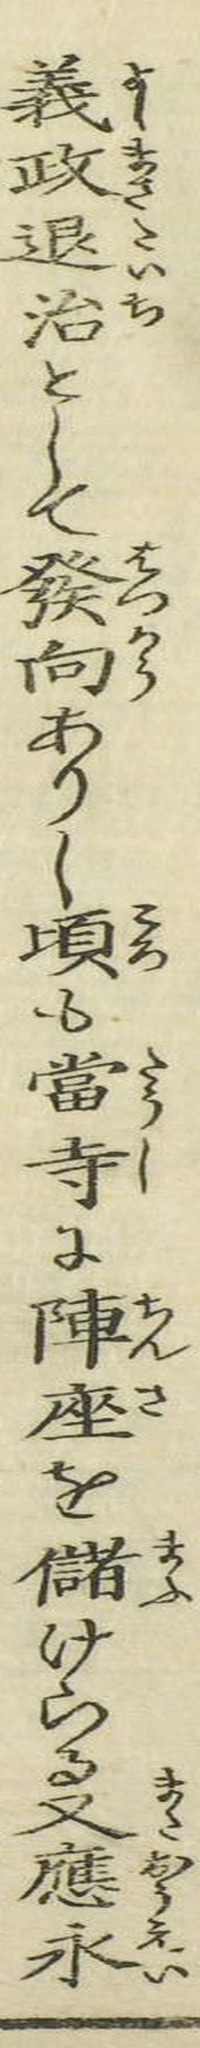義政退治として発向ありし頃も当寺に陣座を儲けらる又応永
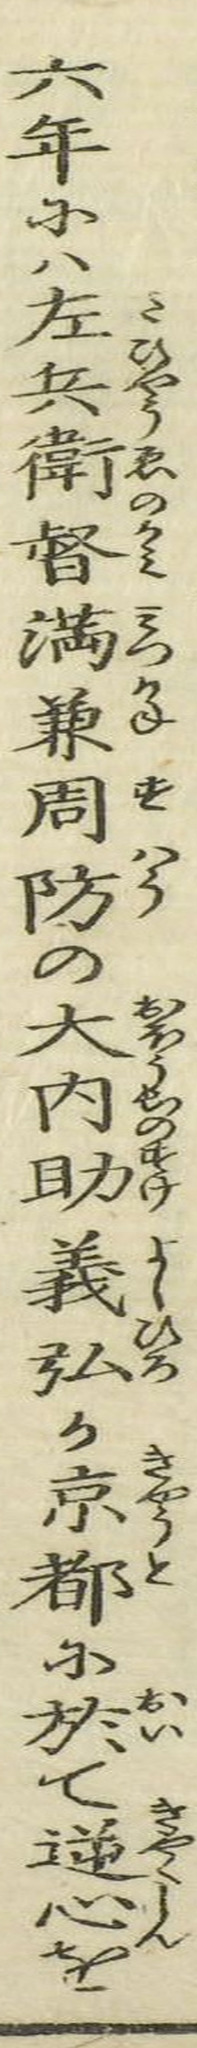六年には左兵衛督満兼周防の大内助義弘か京都に於て逆心を
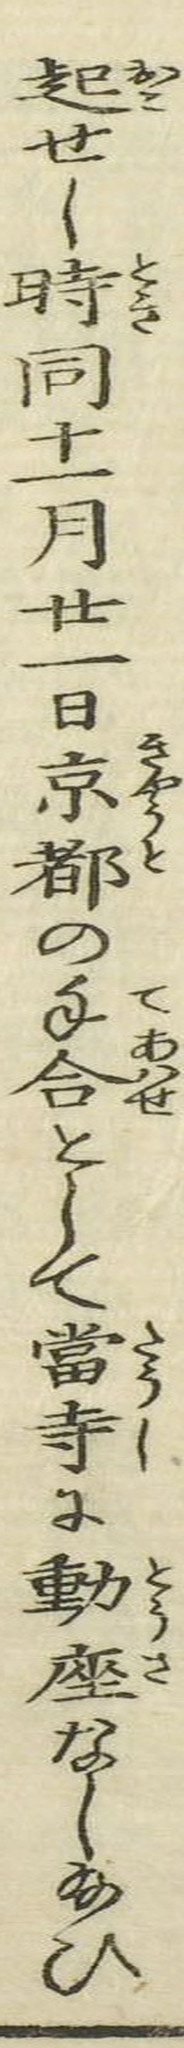起せし時同十一月廿一日京都の手合として当寺に動座なし給ひ
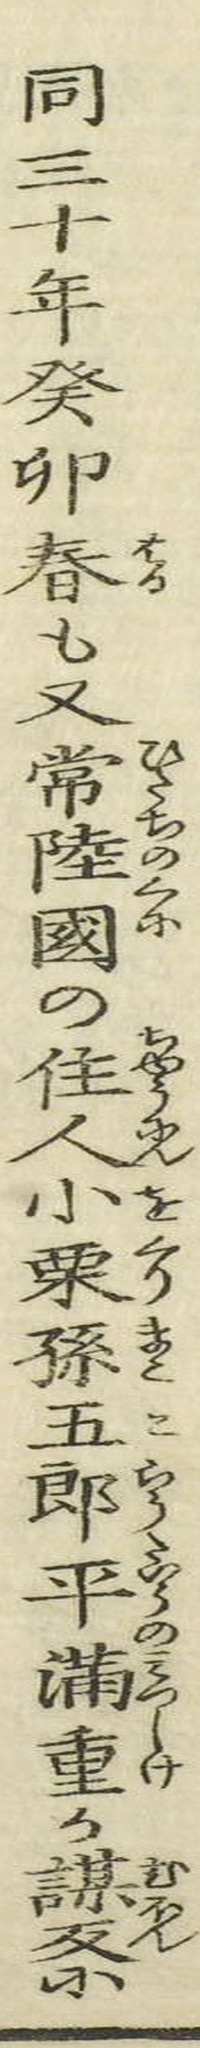同三十年癸卯春も又常陸国の住人小栗孫五郎平満重か謀反に
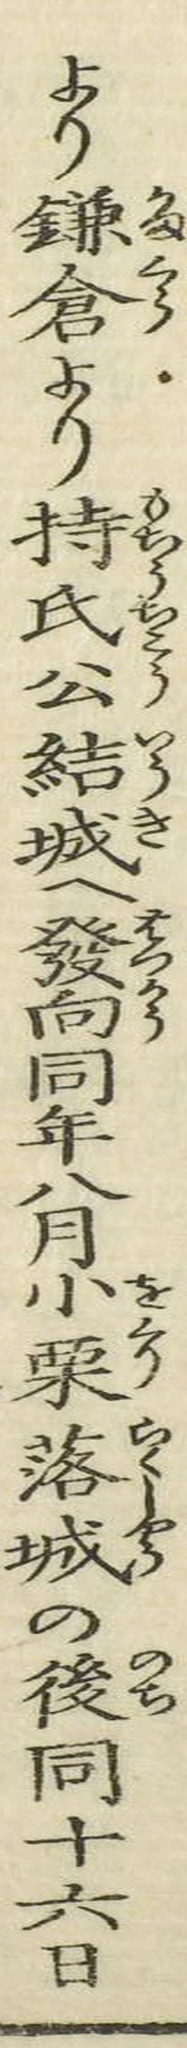より鎌倉より持氏公結城へ発向同年八月小栗落城の後同十六日
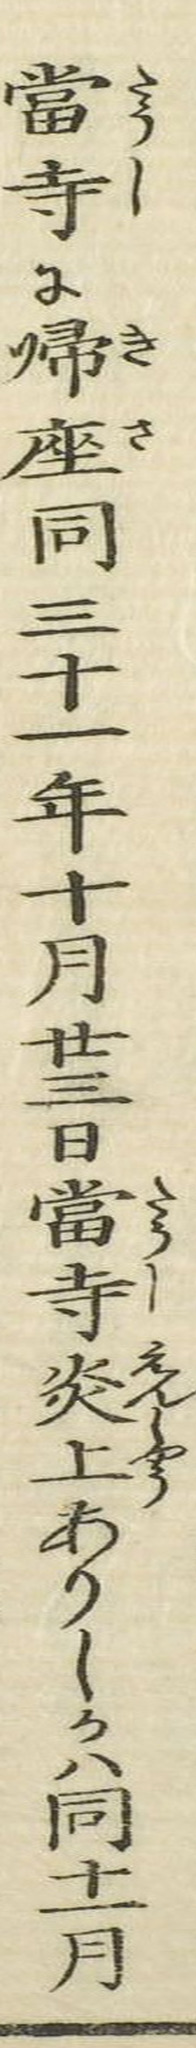当寺に帰座同三十一年十月廿三日当寺炎上ありしかは同十一月
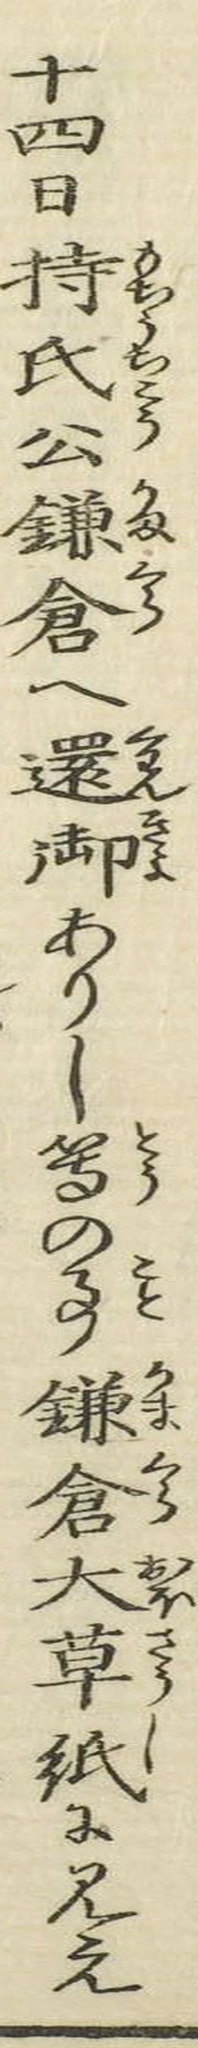十四日持氏公鎌倉還御ありし等の事鎌倉大草子に見え
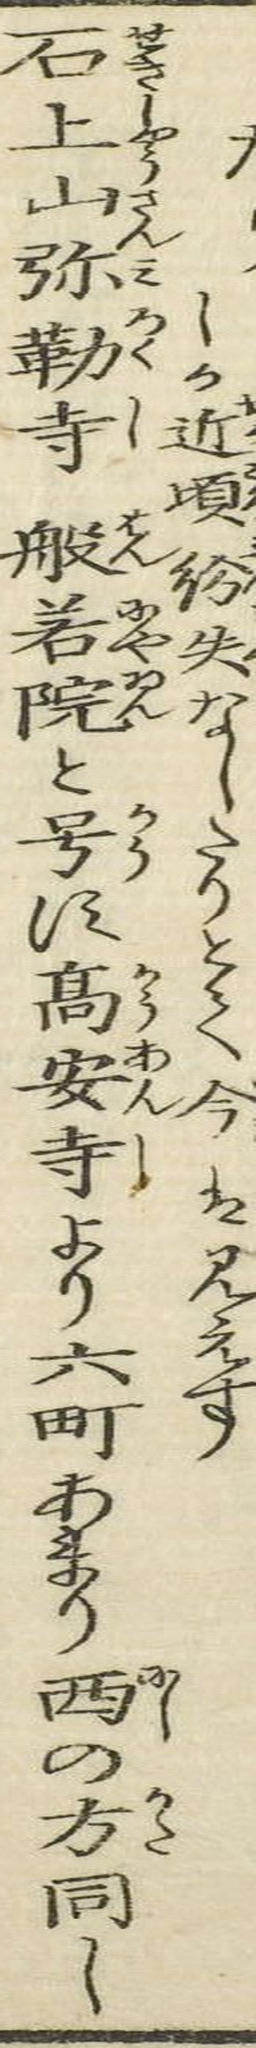石上山弥勒寺般若院と号す高安寺より六町あまり西の方同し
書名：江戸名所図会 20巻 巻之10
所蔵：東京学芸大学教育コンテンツアーカイブ
